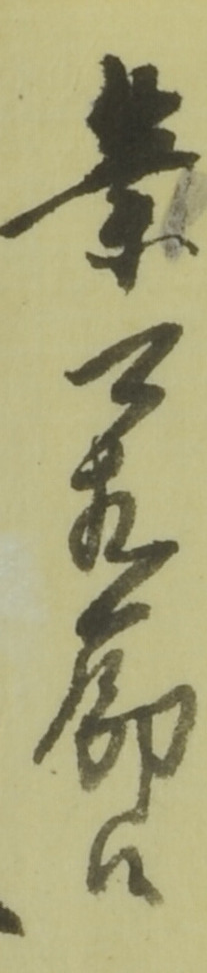業可相励候
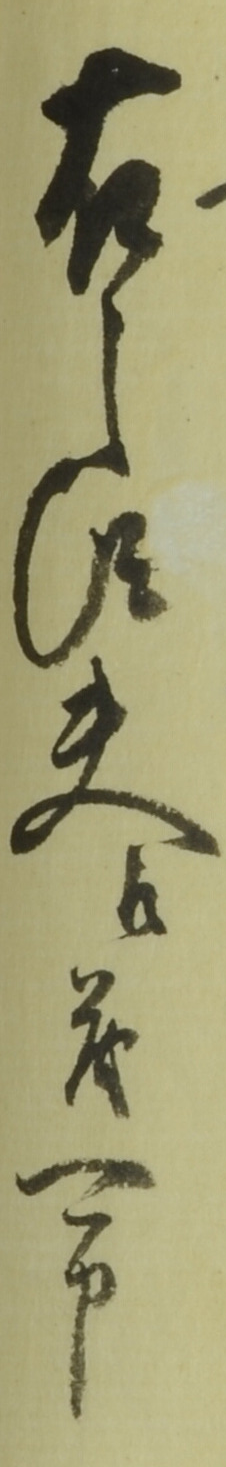右之趣夫江も可申
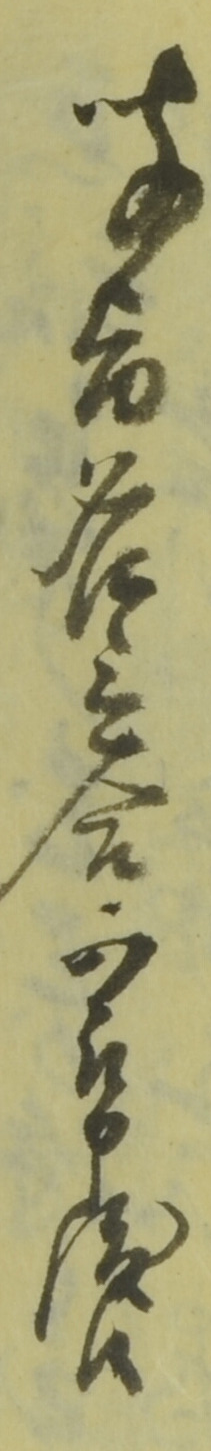聞旨各立会可被申渡候

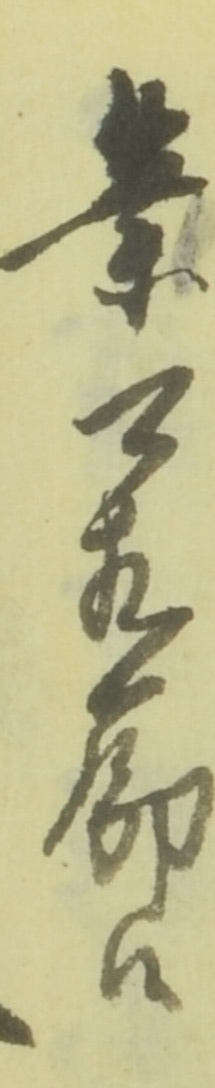業可相励候
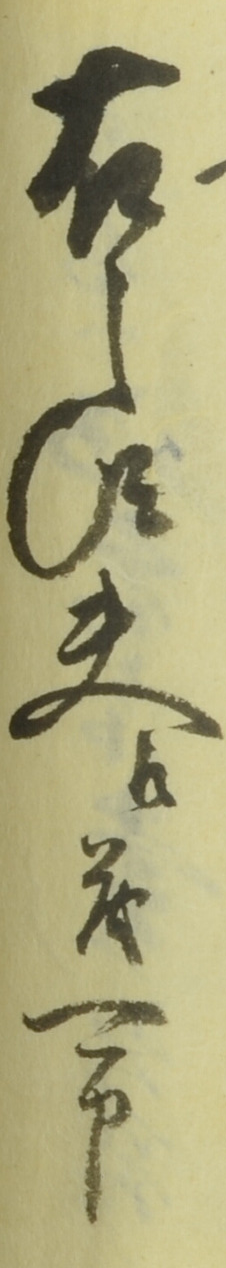右之趣夫江も可申
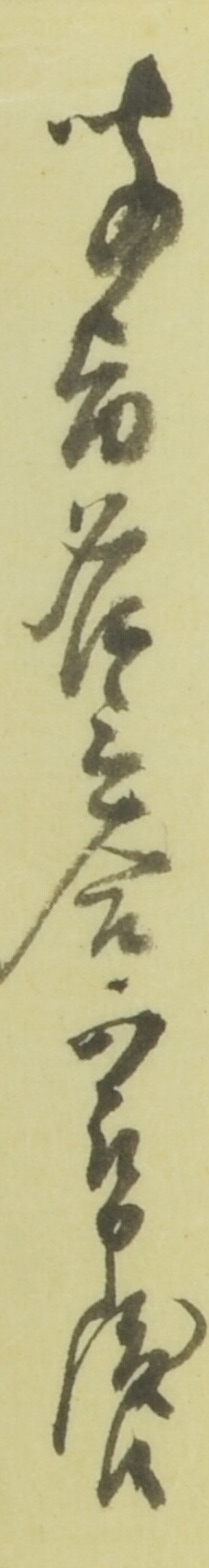聞旨各立会可被申渡候
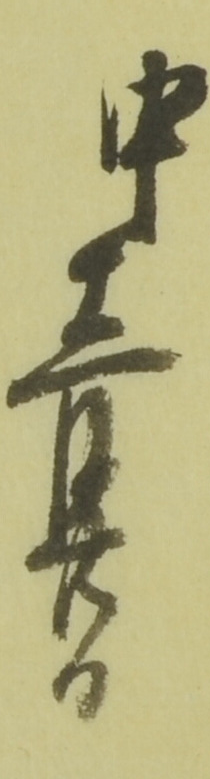申十二月廿日
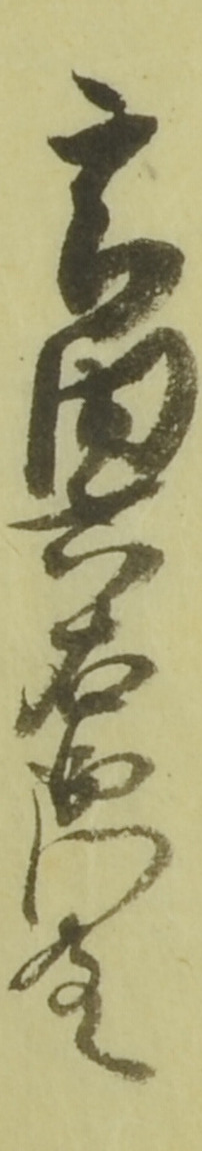高田六右衛門殿
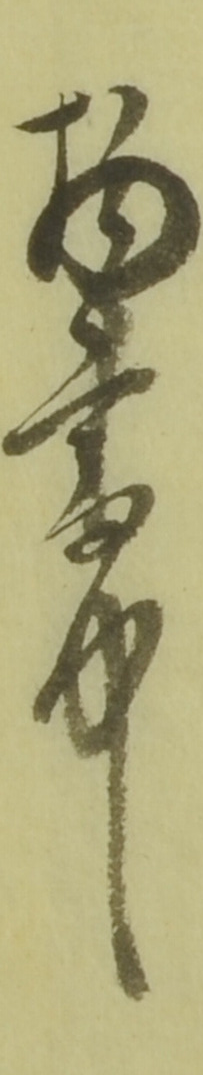物書中
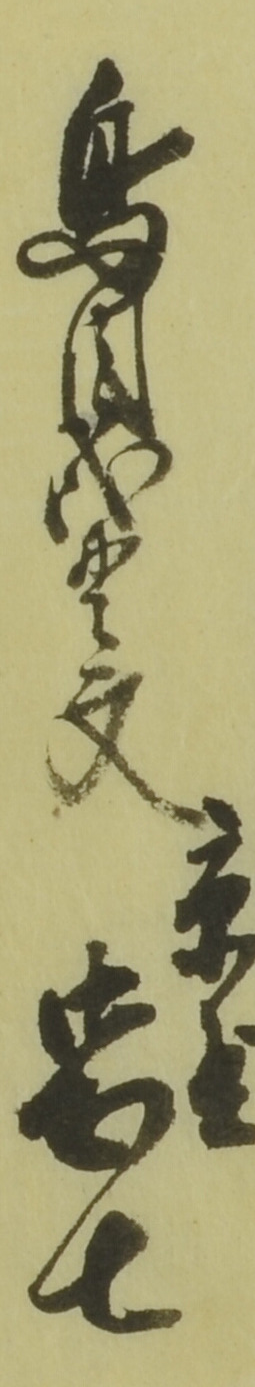鳥目弐貫文忠七
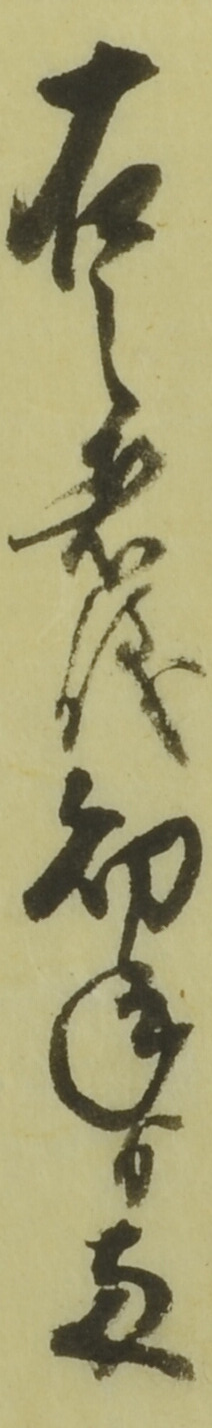右之者儀幼年ゟ両
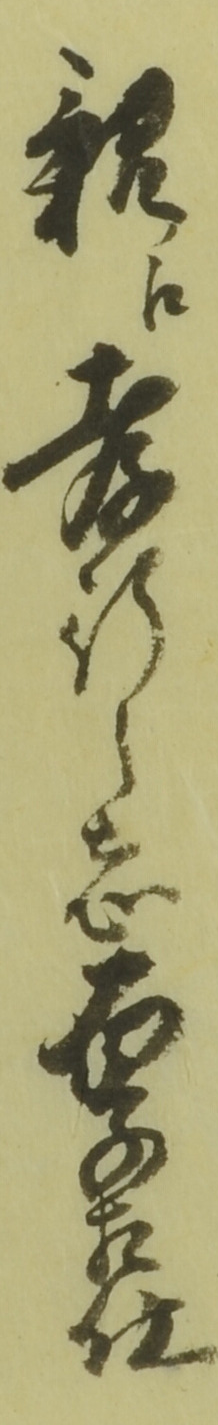親江孝行之志厚相仕
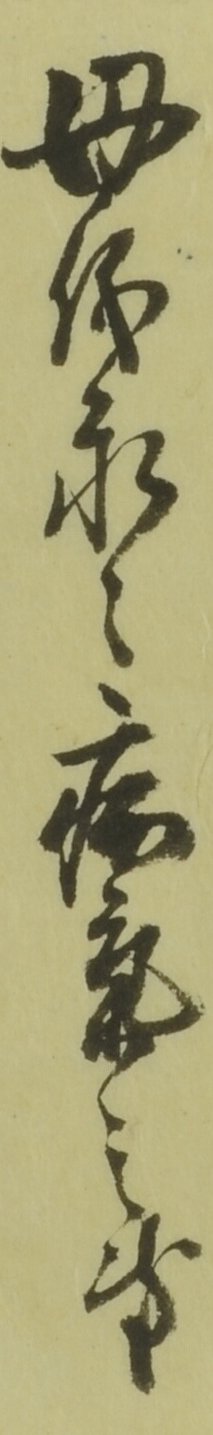母儀永々病気之処
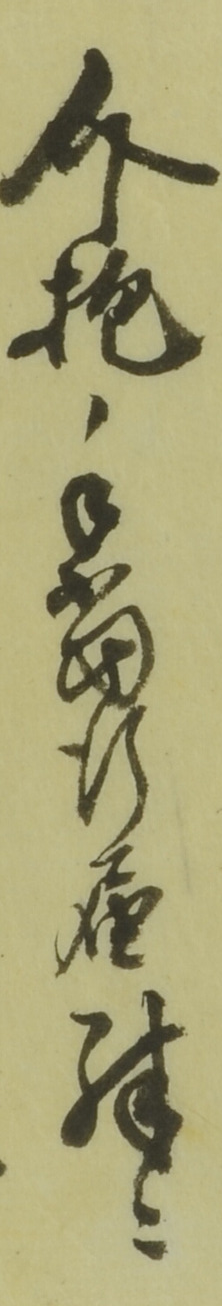介抱手当行届殊ニ
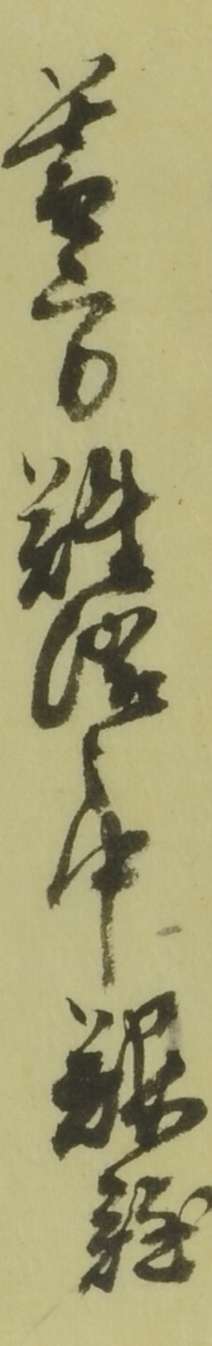暮方難渋之中艱難
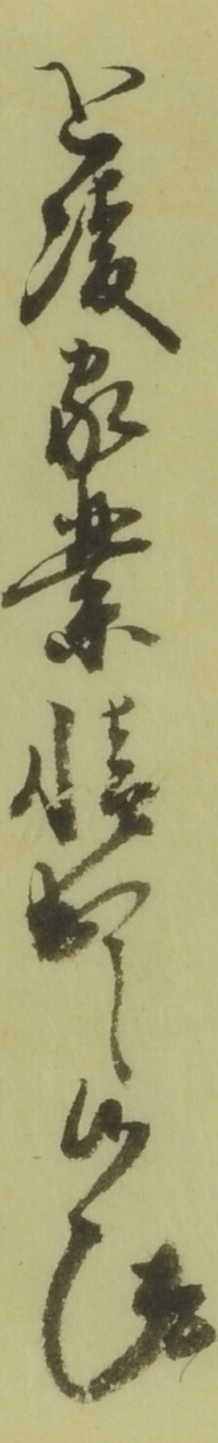を凌家業情出し候趣
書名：御触書御書附控
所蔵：伊那市立高遠町図書館・合同会社AMANE
